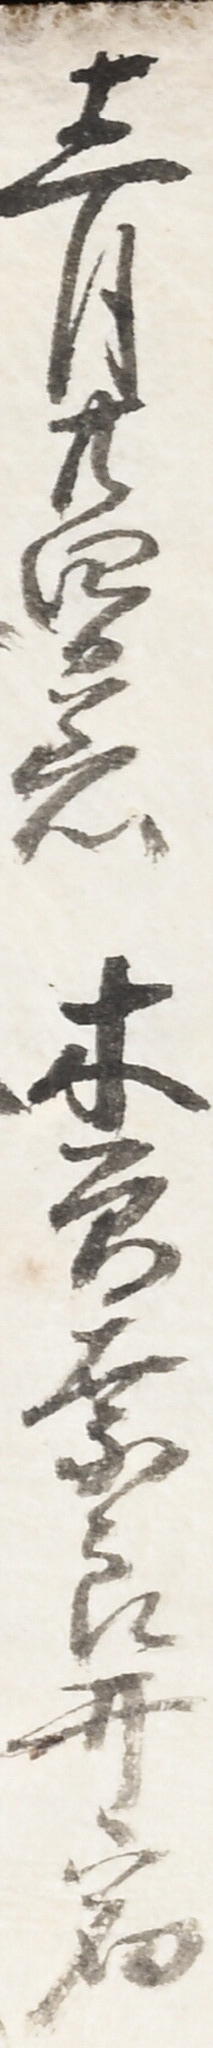十二月廿四日着木曽奈良井宿
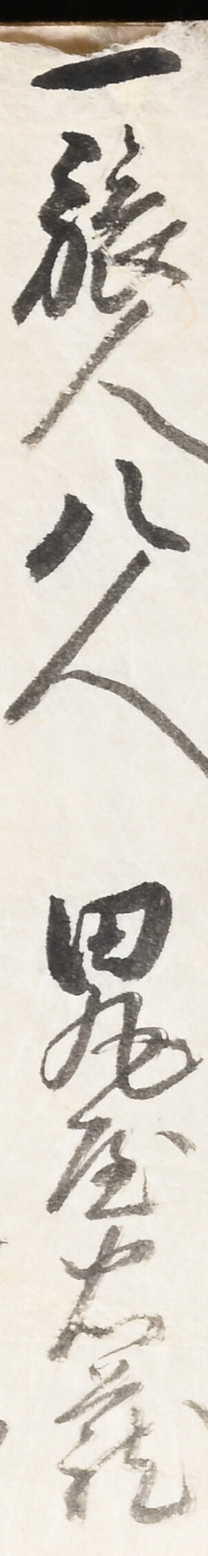一旅人八人田丸屋忠蔵
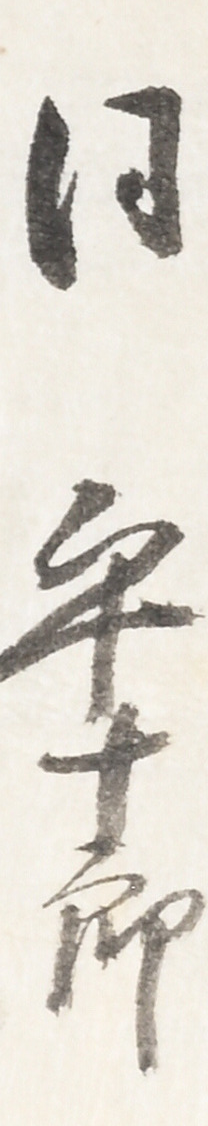同平十郎
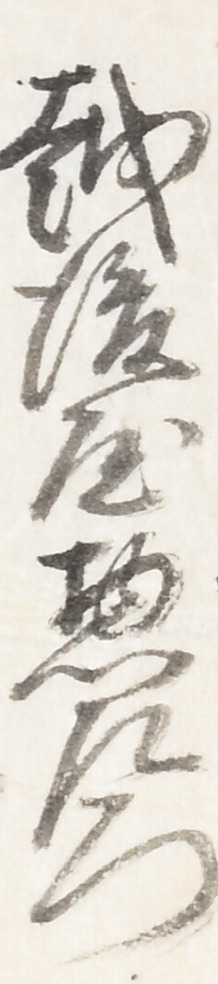越後屋惣左衛門
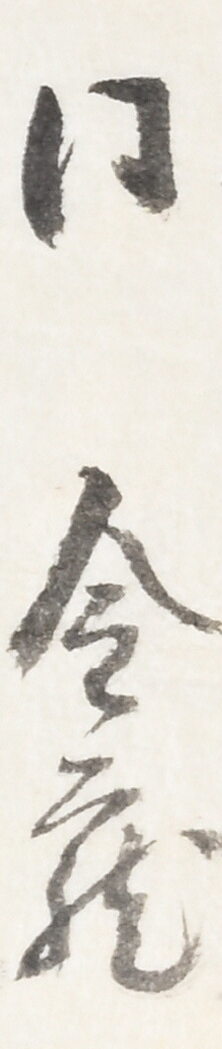同金蔵
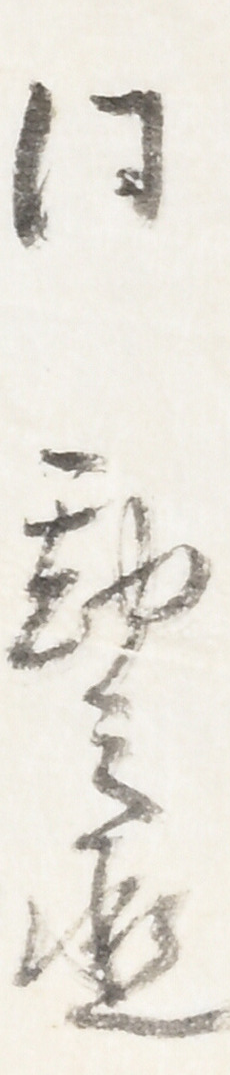同勘之丞
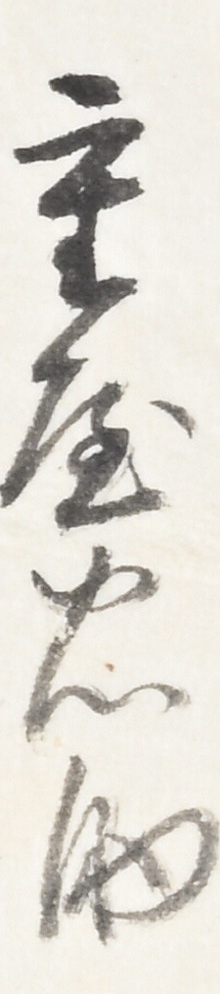重屋忠助
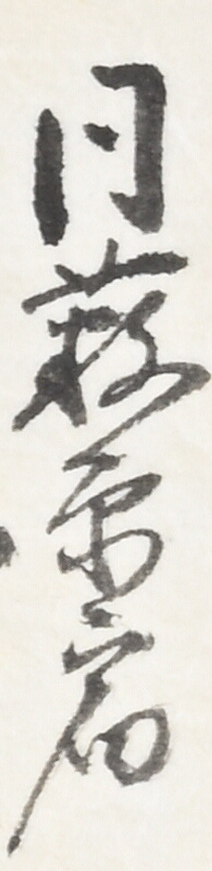同藪原宿
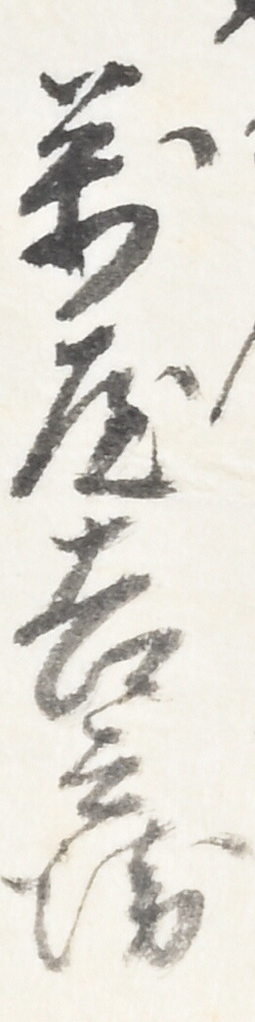万屋吉兵衛
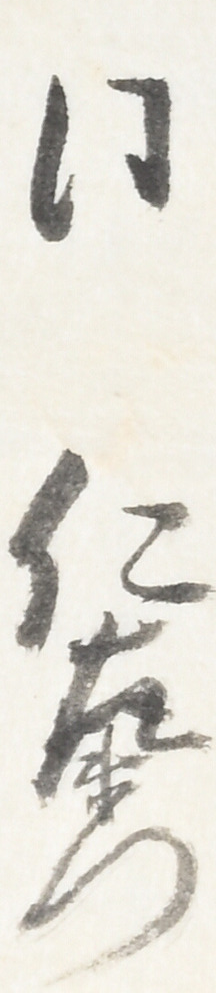同仁左衛門
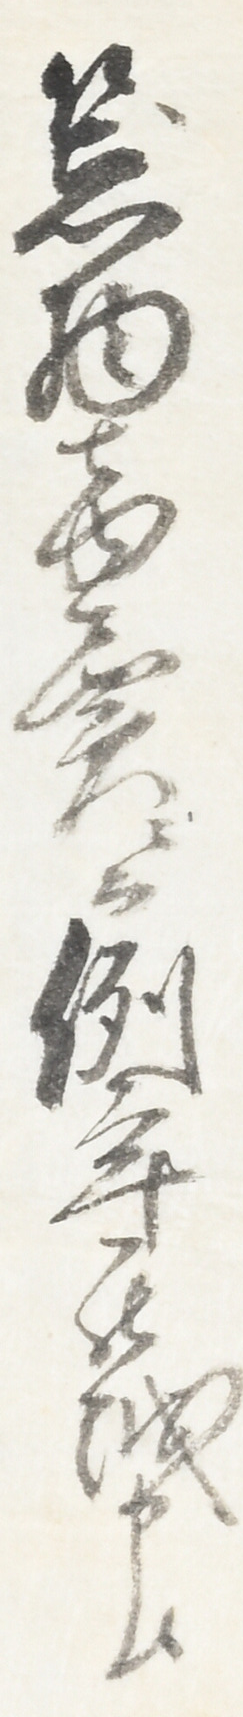器物商売ニ而例年罷越申候
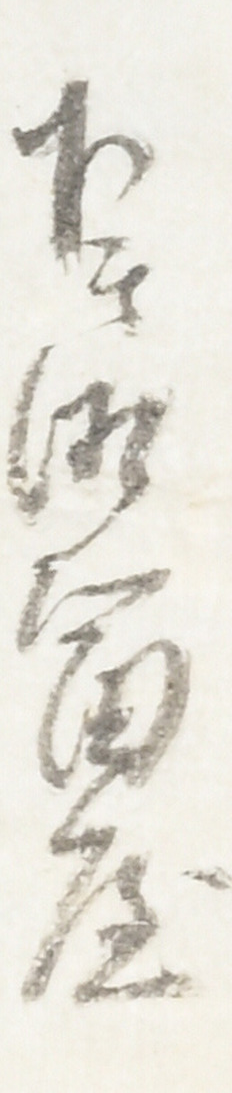下モ町冨屋
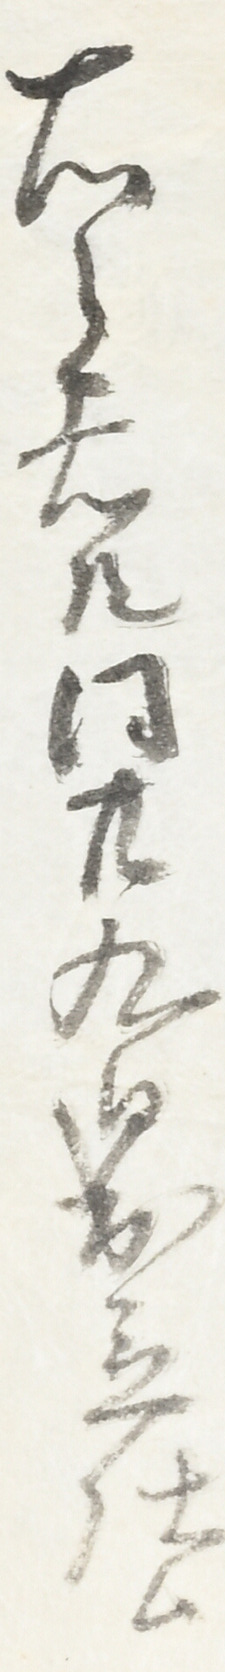右之者共同廿九日出立仕候

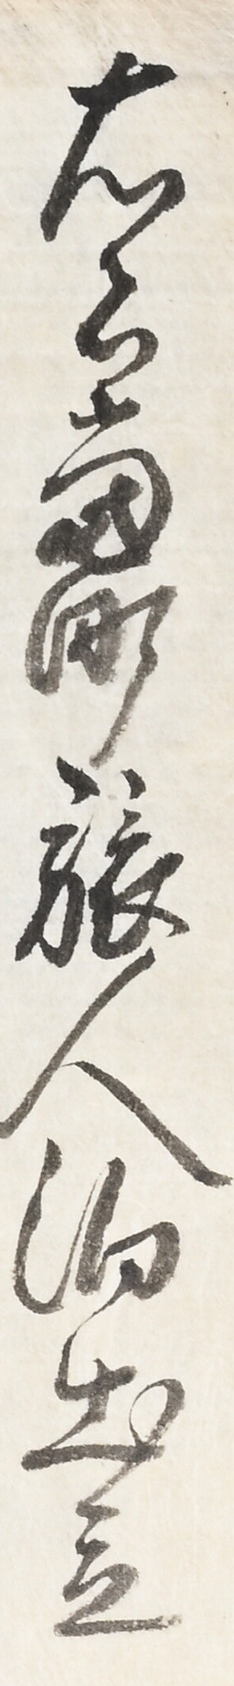右者当町旅人泊出立
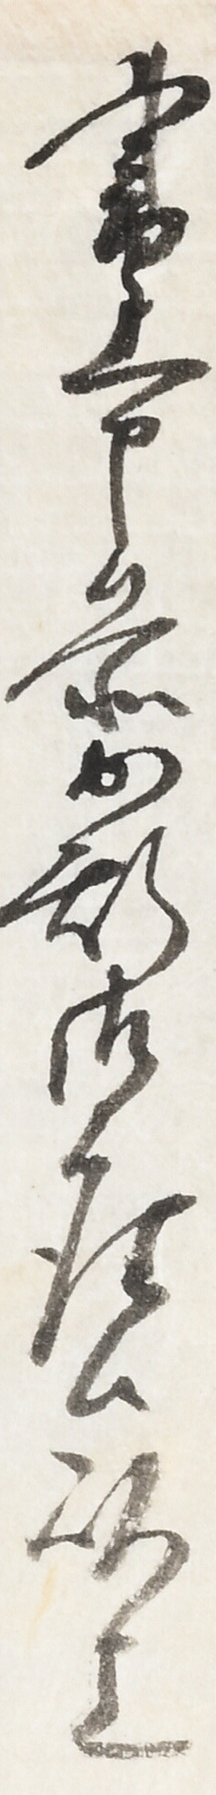書上申候所如斯御座候以上
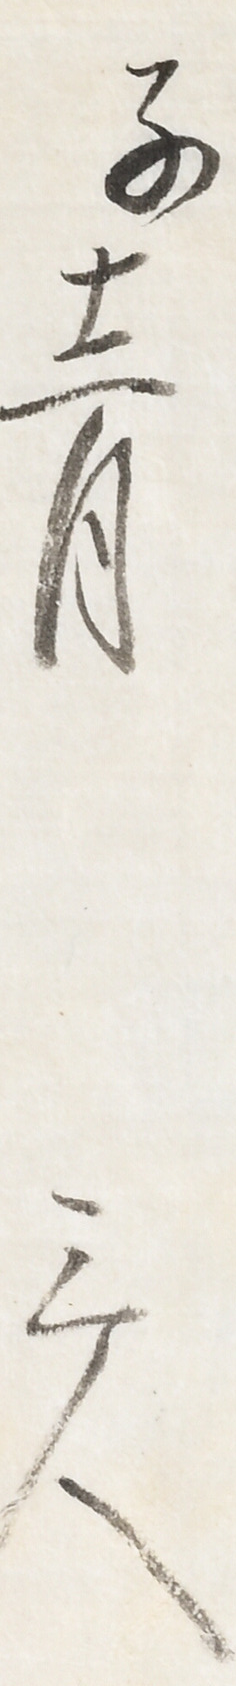子十二月三人
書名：旅人泊控帳
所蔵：伊那市立高遠町図書館・合同会社AMANE
